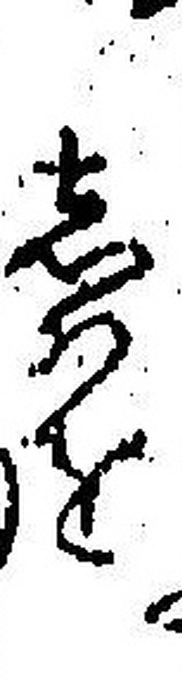しはを
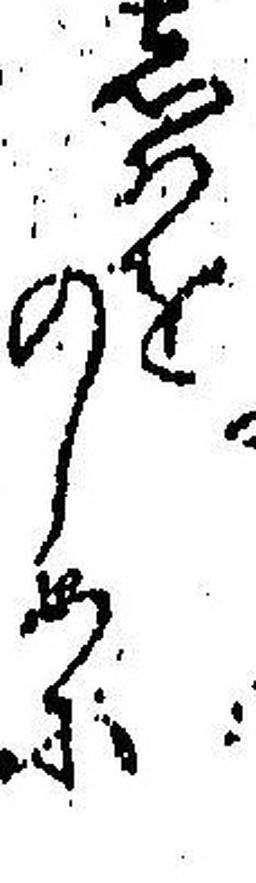のしめに
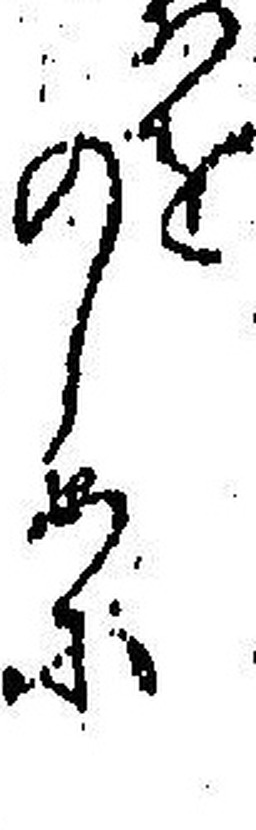のしめに
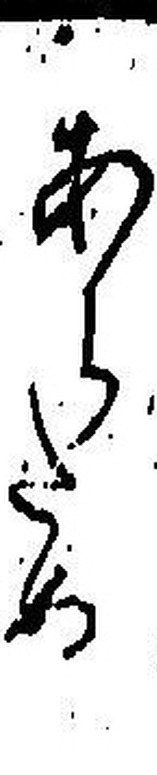あらため
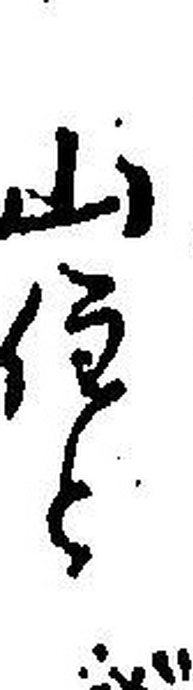山住と
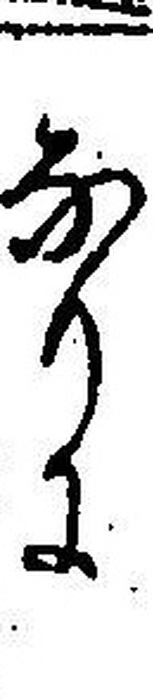なりに
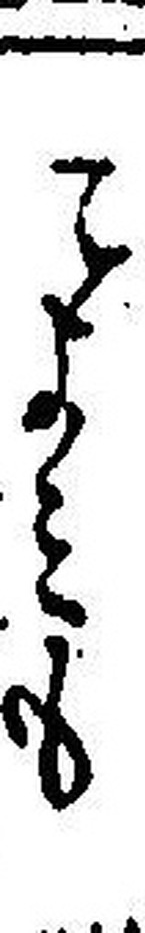こよみも
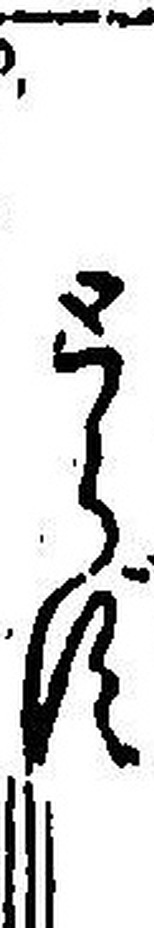とらず
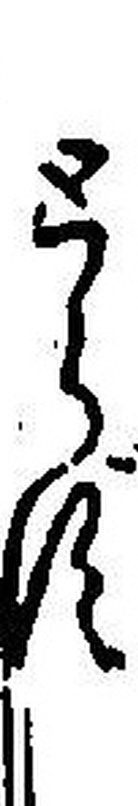とらず
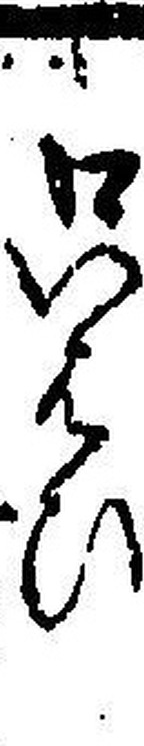口いはひ
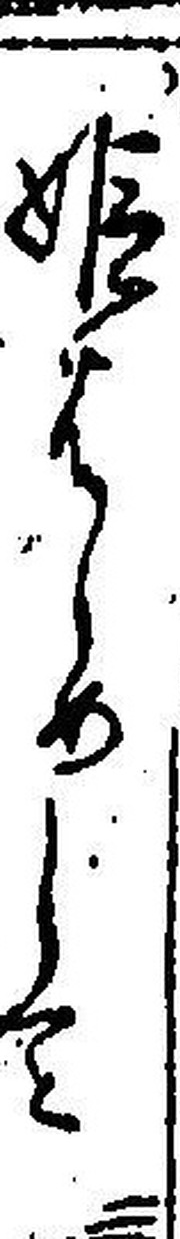姫はしめして
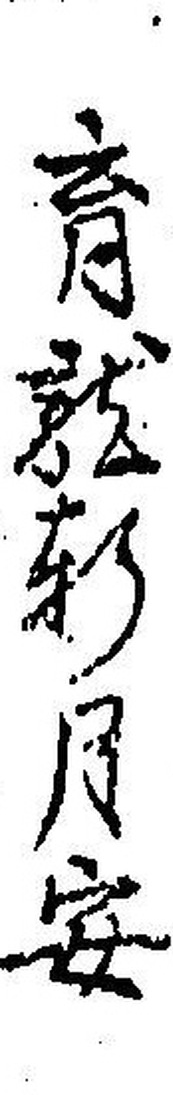育龍軒月安
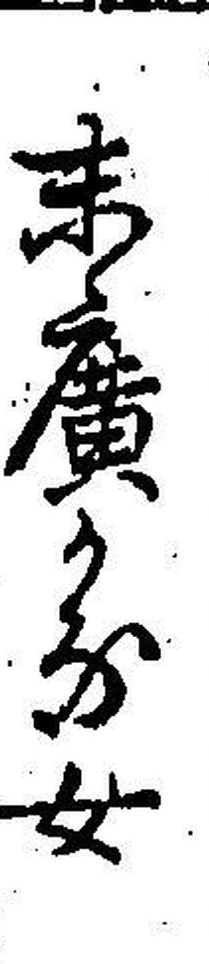末広かな女
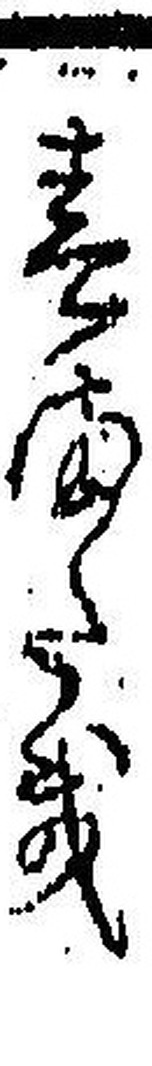春またき
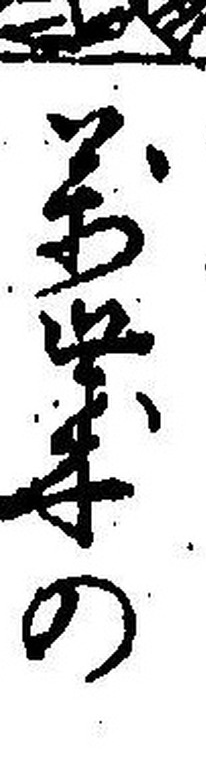万歳の
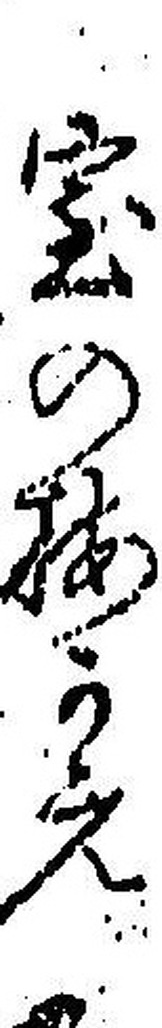宝の梅かえ
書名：どうれ百人一首 / 鹿都部真顔(狂歌堂)編
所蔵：東京大学総合図書館 General Library in the University of Tokyo, JAPAN
